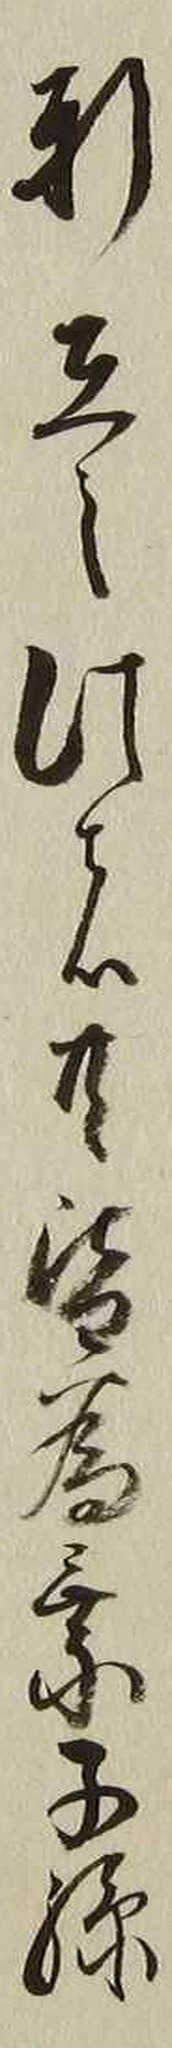軒在之此者共皆為乗子孫
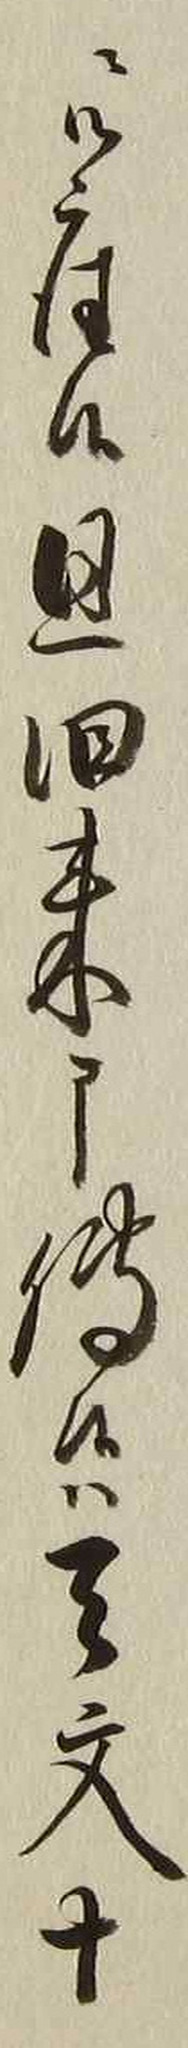ニ御座候且旧来申伝候ハ天文十
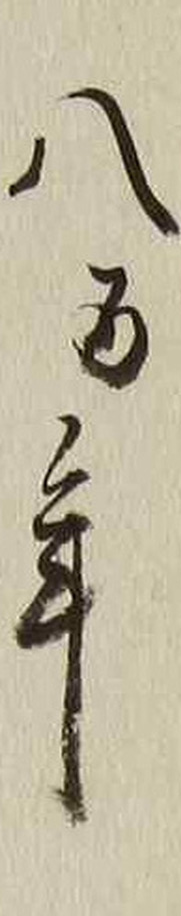八酉年
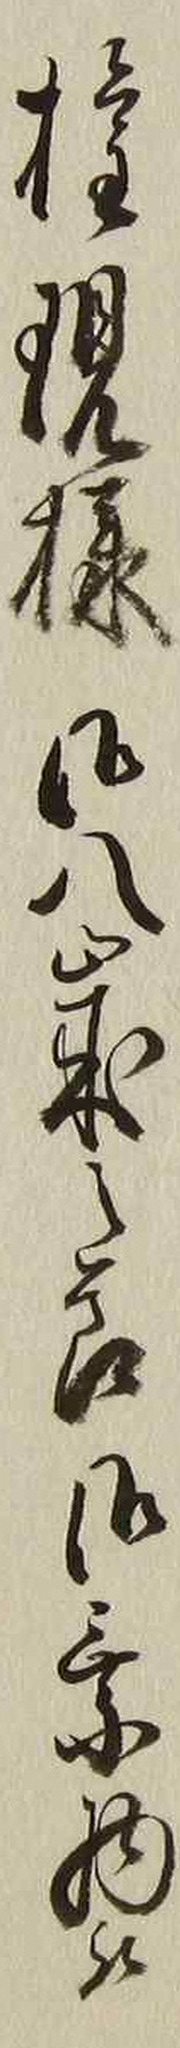権現様御八歳之節御乗物被
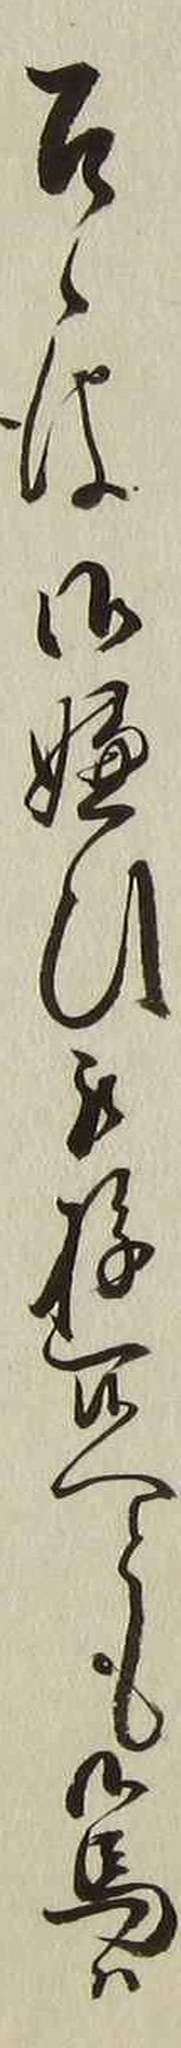召候後御嫌ひ被遊候へとも御馬ハ
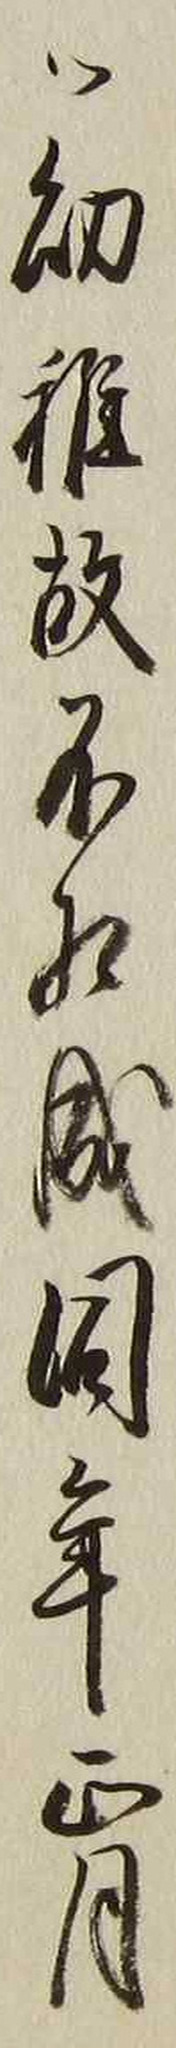御幼稚故不相成同年正月
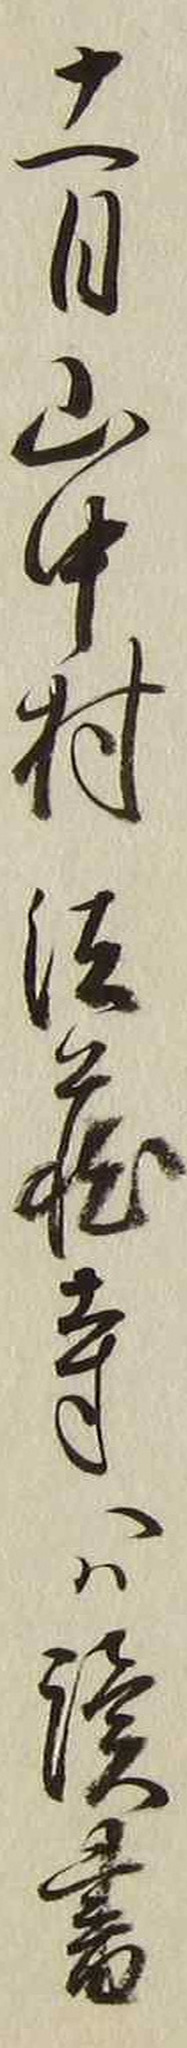十一日山中村法蔵寺へハ読書
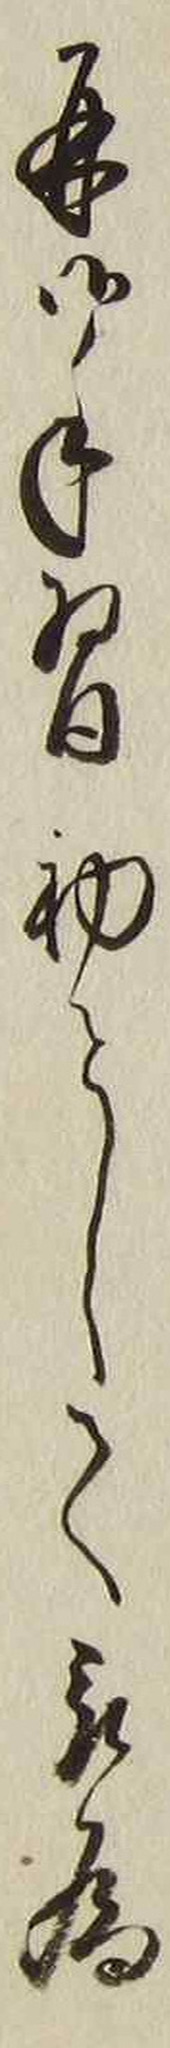再御手習初として被為
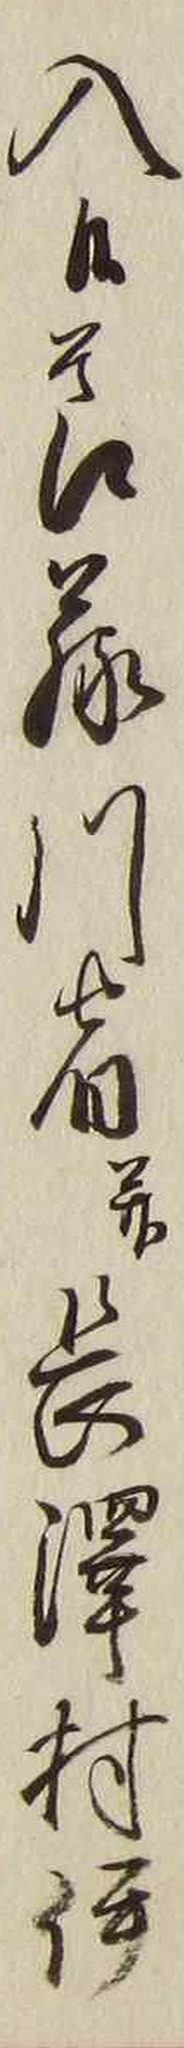入候節藤川宿并長沢村伊

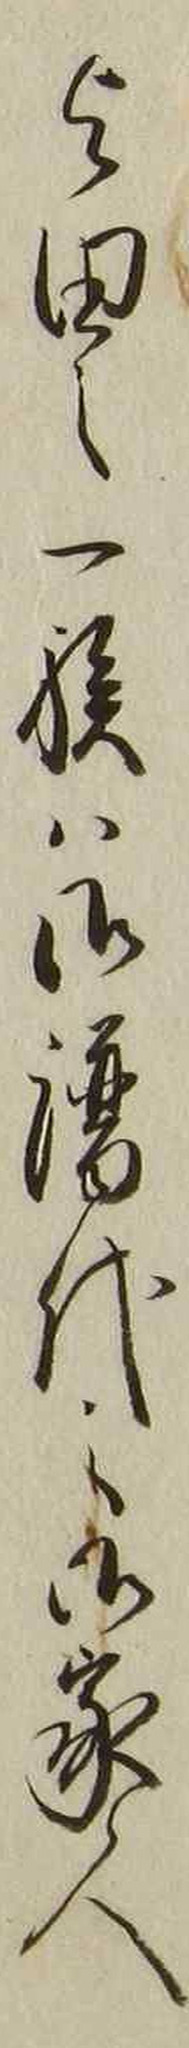与田之一族ハ御譜代之御家人
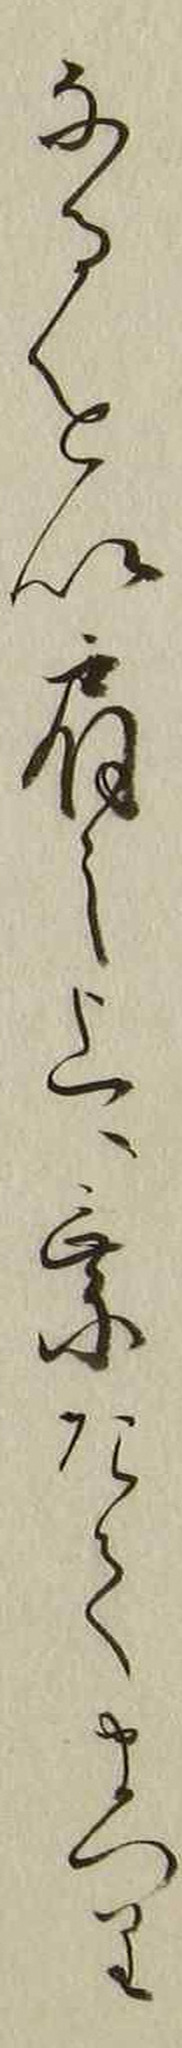なるを以肩之上へ乗たてまつり
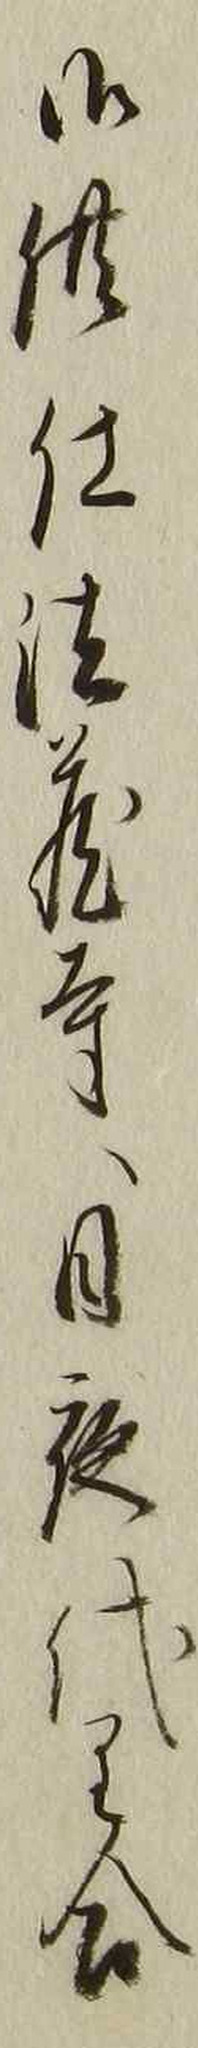御供仕法蔵寺へ日夜代り合
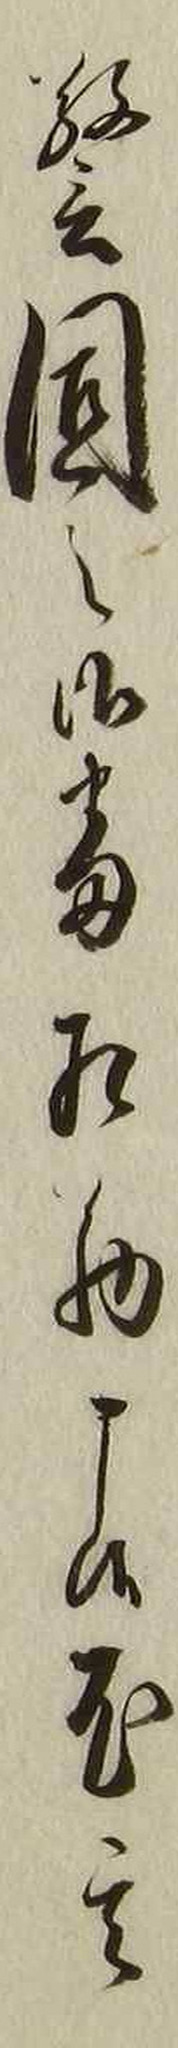警固之御番相勤申候尤其
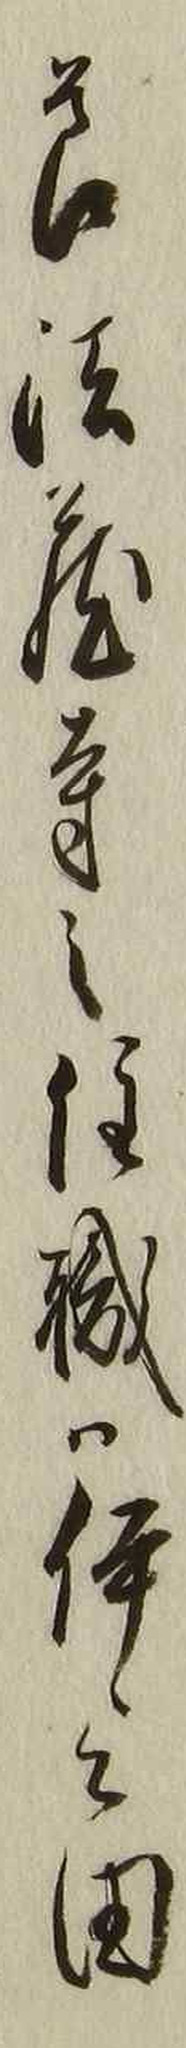節法蔵寺之住職ハ伊与田
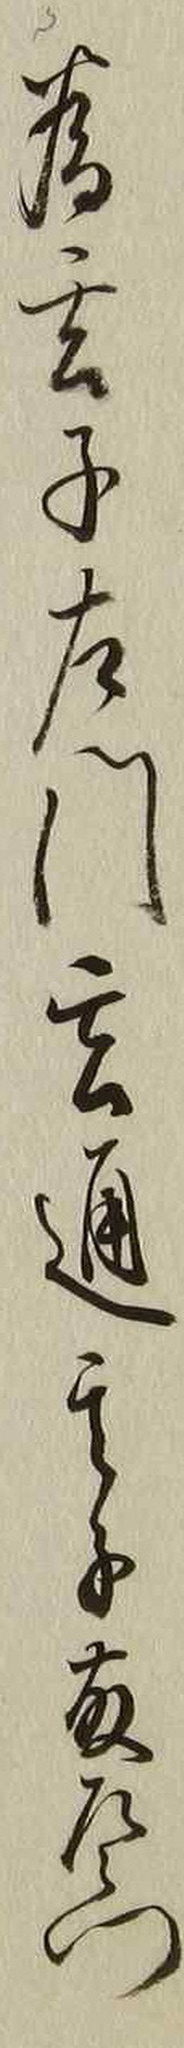為玄子左門玄通其子籐左衛門
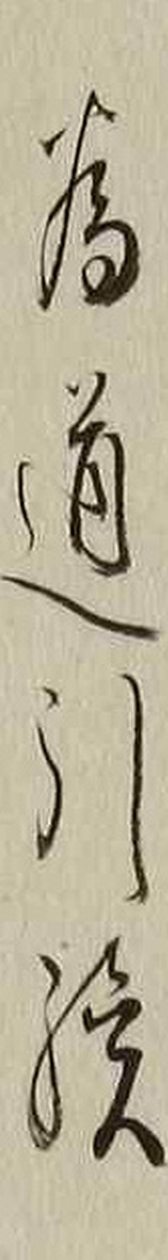為道引続
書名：諸士系譜　巻之18　い之部18
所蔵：会津若松市立会津図書館
